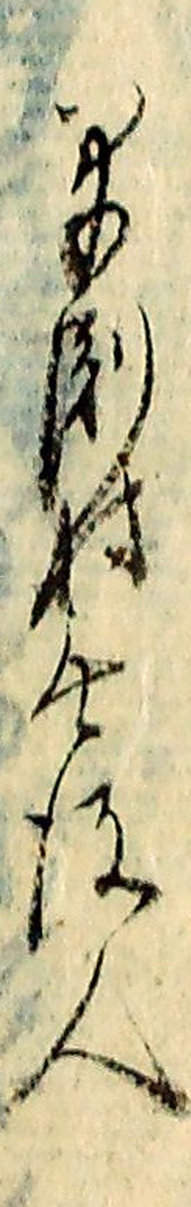早淵村無役人
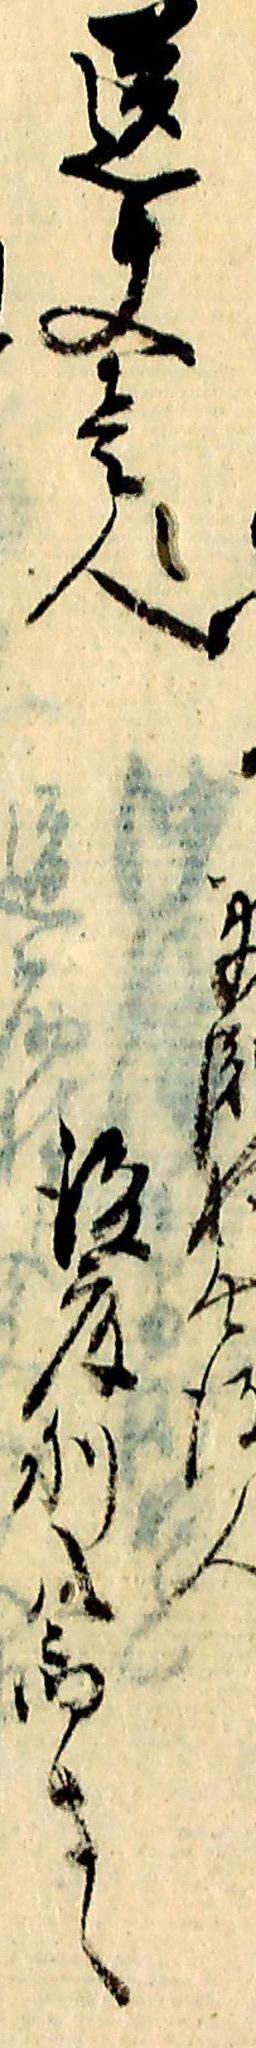送夫壱人後藤利八郎方へ
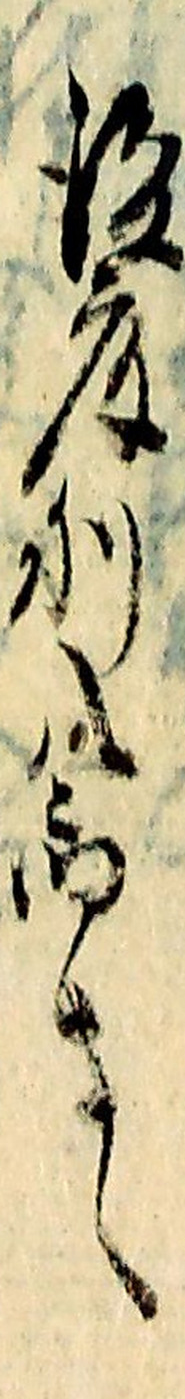後藤利八郎方へ
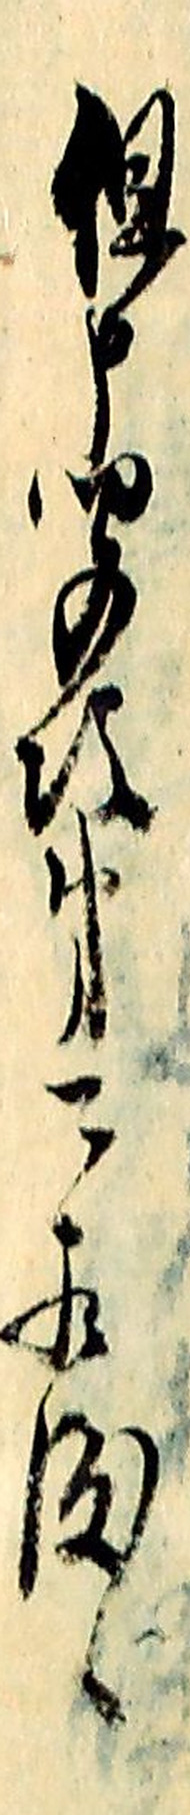但申聞次第可相渡候
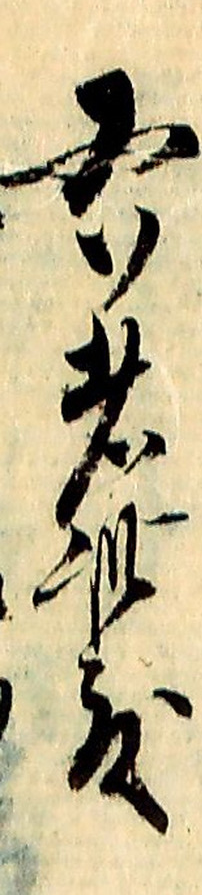右は此度
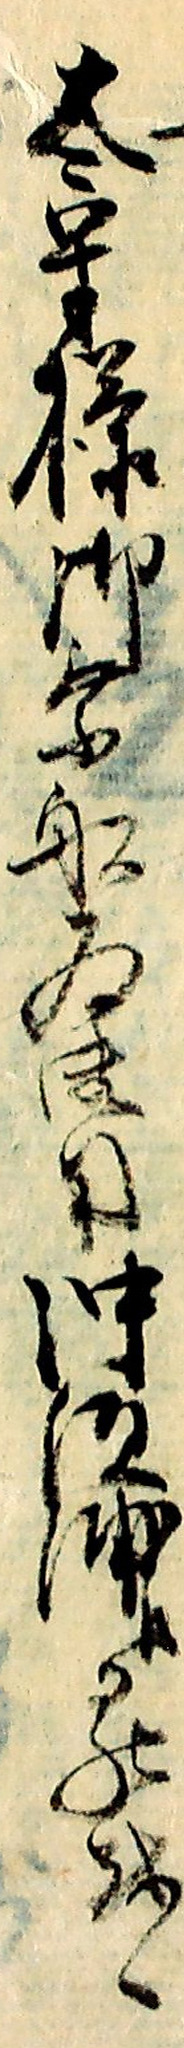太守様御乗船為御用沖須浦え罷越候
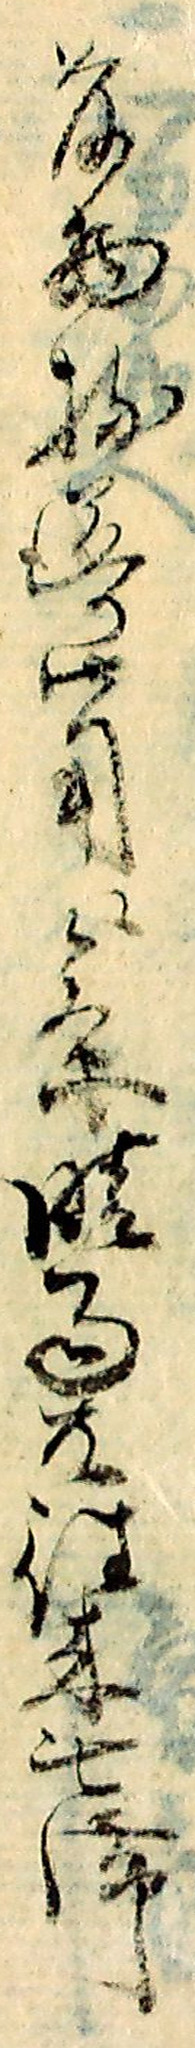荷物持送り御用に候条晴雨共往来無滞
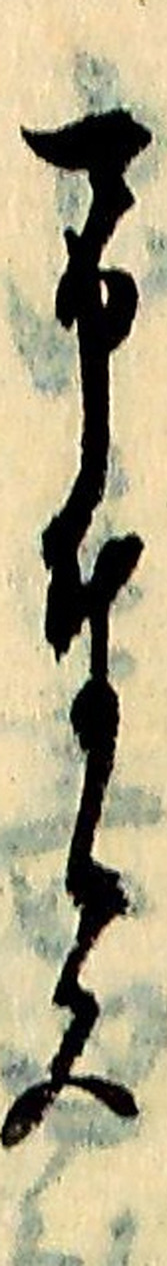可申付候以上
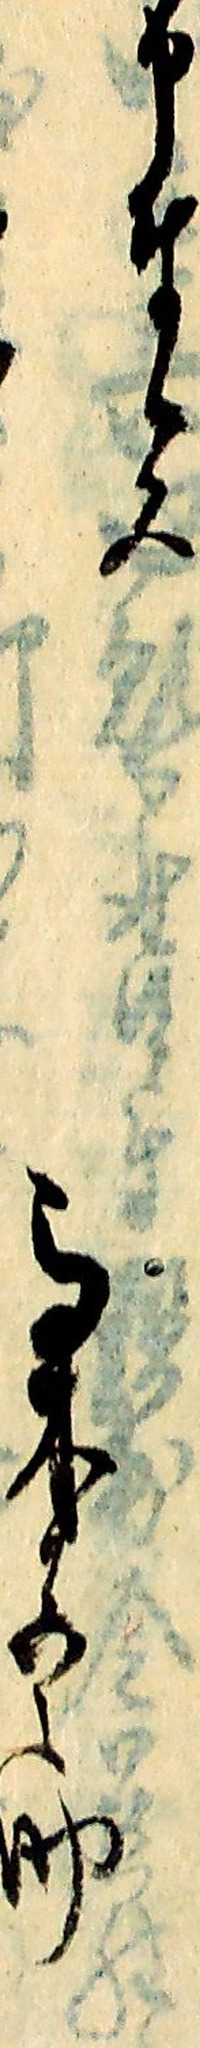可申付候以上
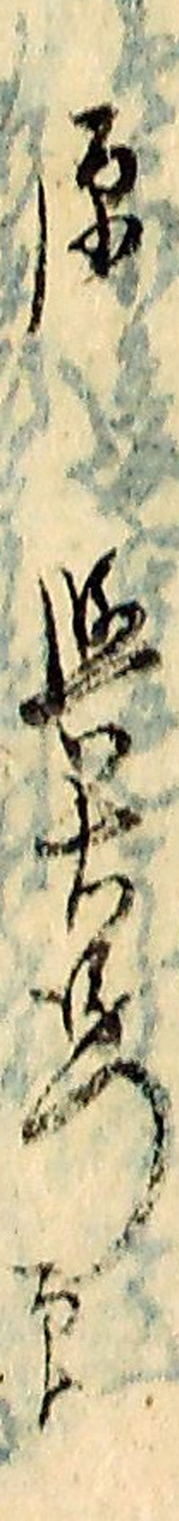原与右衛門印
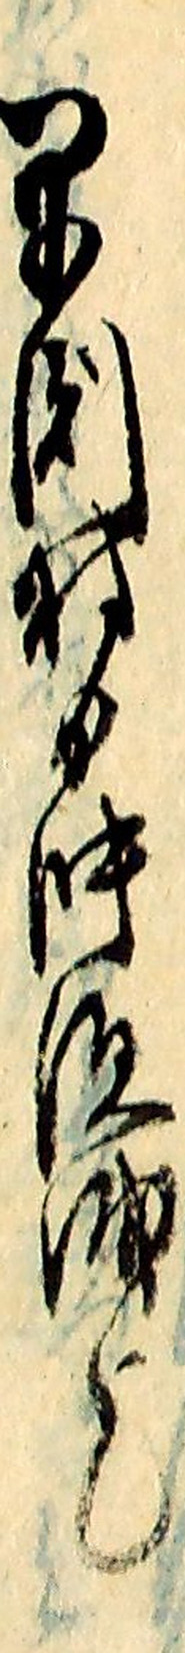早淵村ゟ沖須浦迄
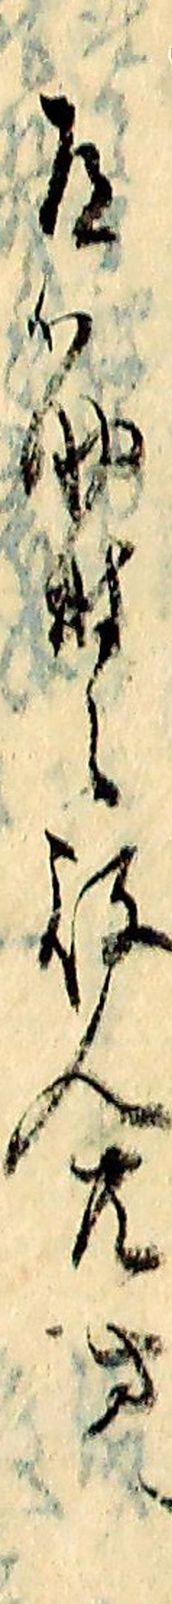道筋村々役人共方へ

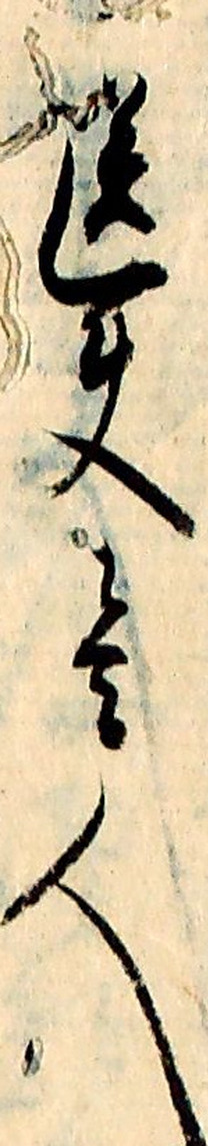送夫壱人
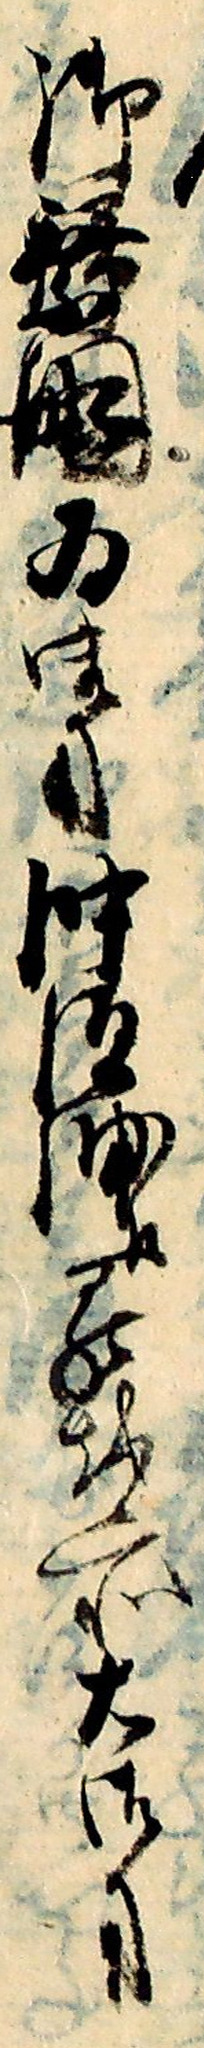御乗船為御用沖須浦え罷越候所右御用
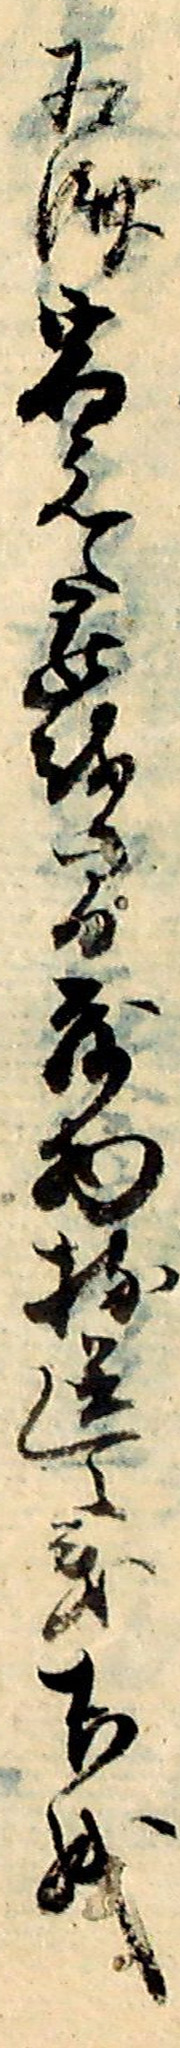相済宿元へ罷越候間荷物持送之義別紙
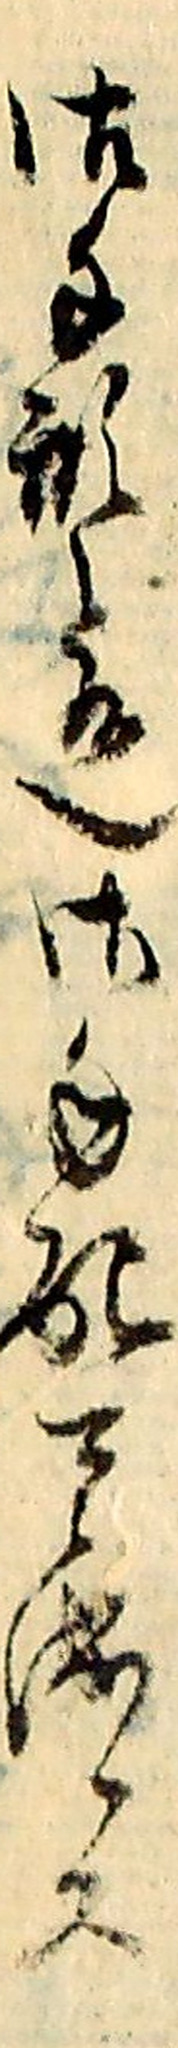御手形之通御手配可被成候以上
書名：諸御願書控(後藤氏壱番）
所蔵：鳴門教育大学 Naruto University of Education
